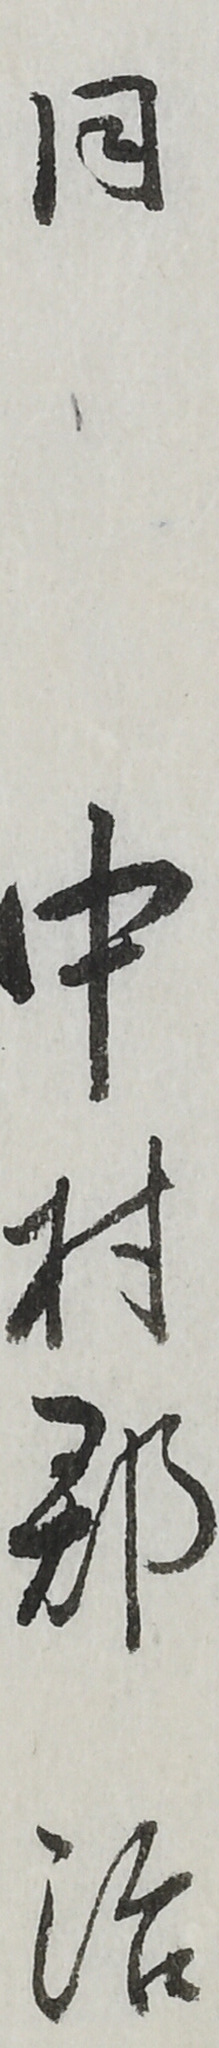同中村郡治
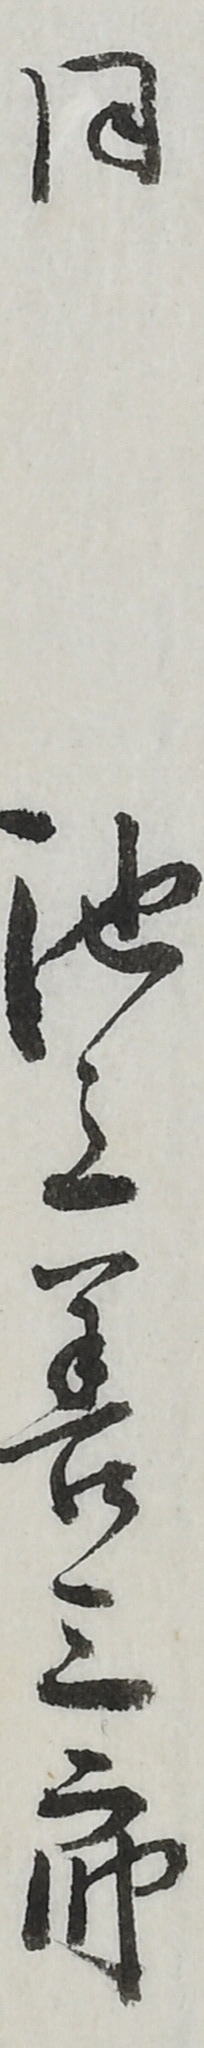同池上善三郎

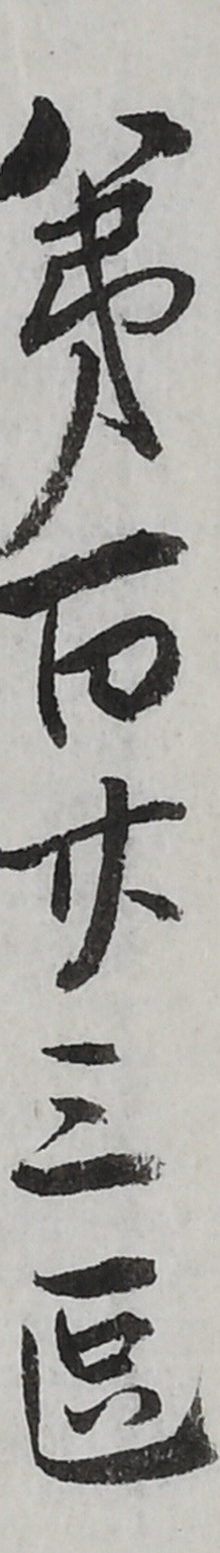第百廿三区
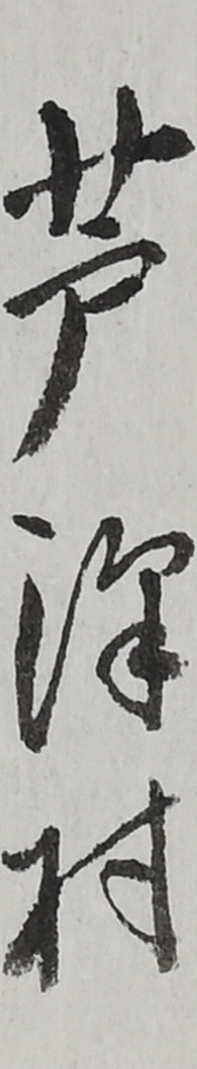芦澤村
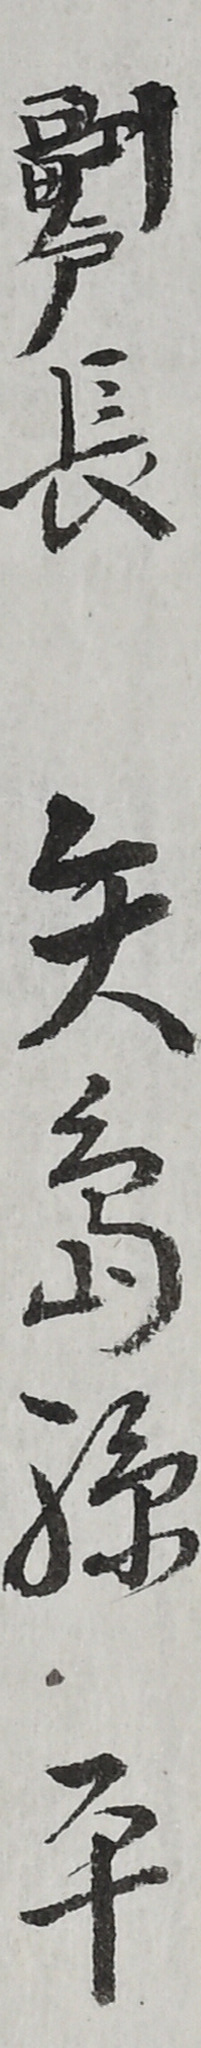副戸長矢島孫平
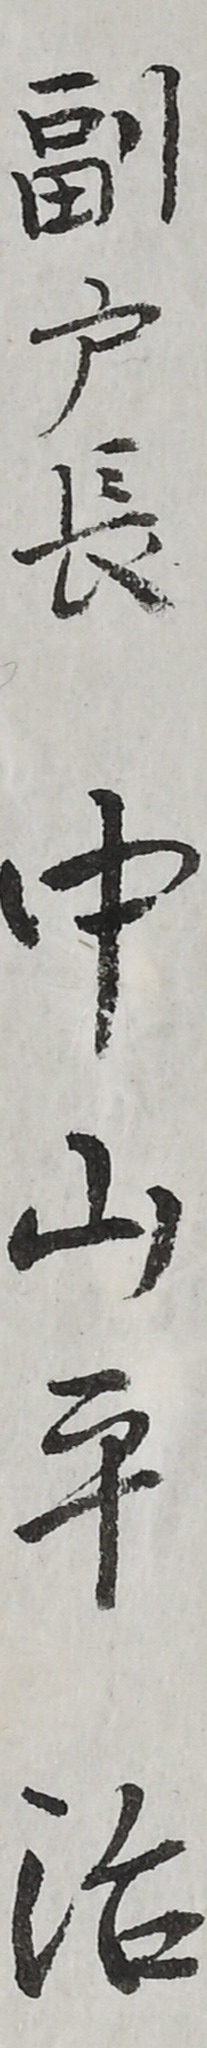副戸長中山平治
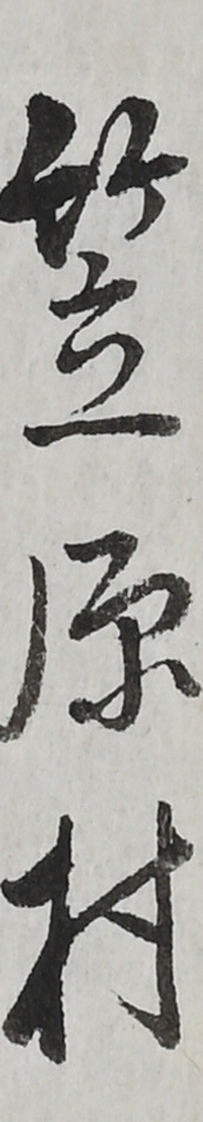笠原村
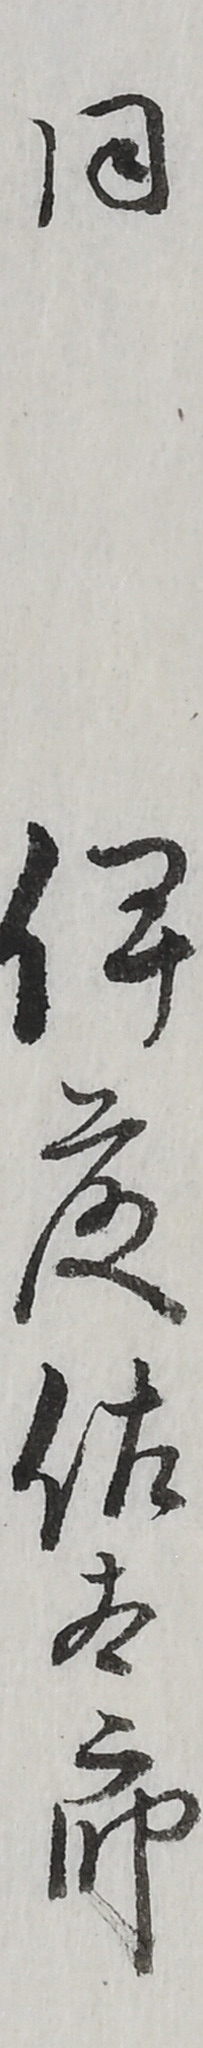同伊藤佐太郎
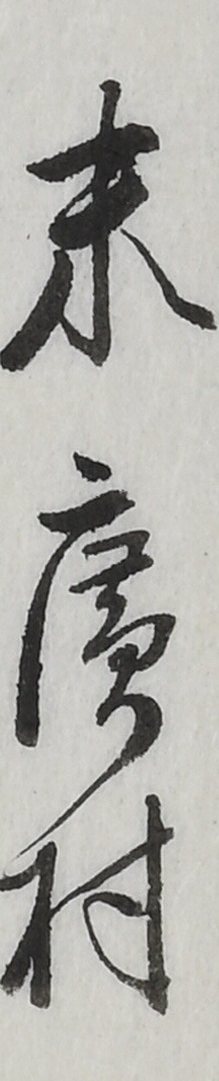末広村
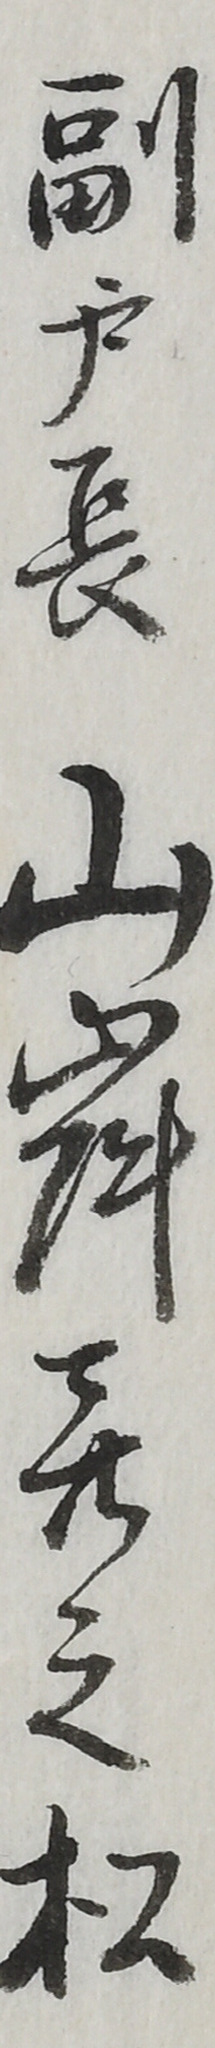副戸長山岸喜之松
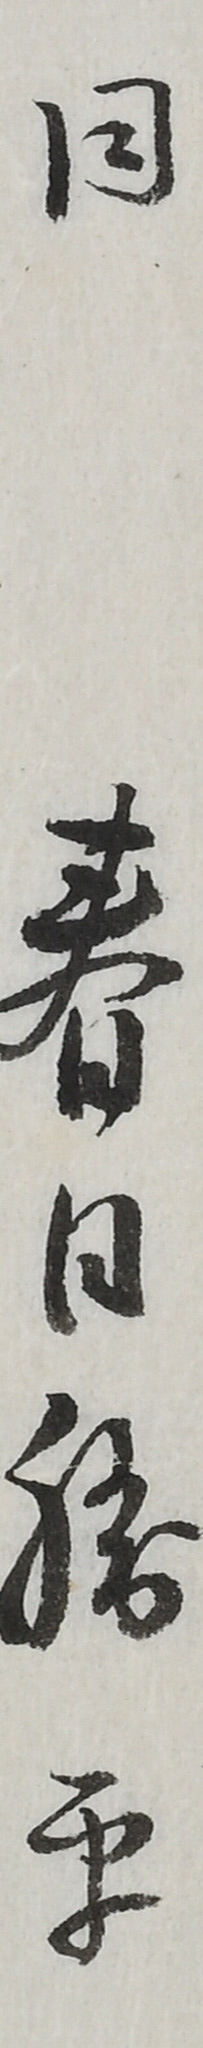同春日勝平
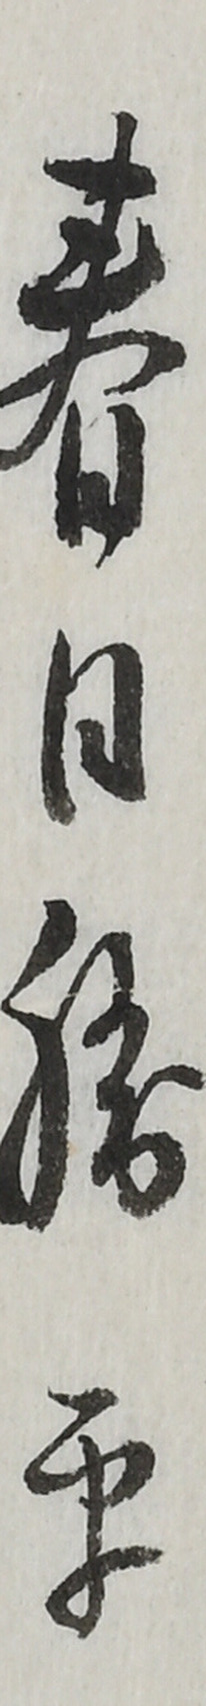同春日勝平
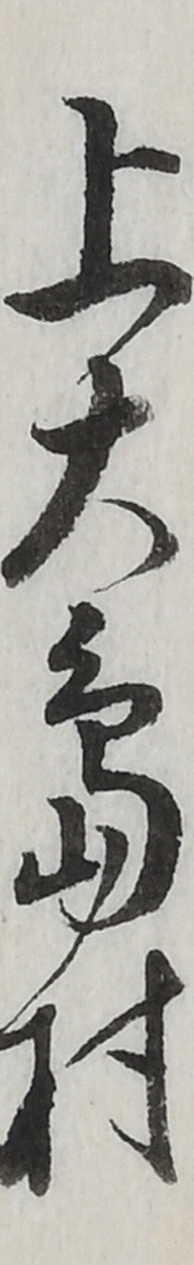上大島村
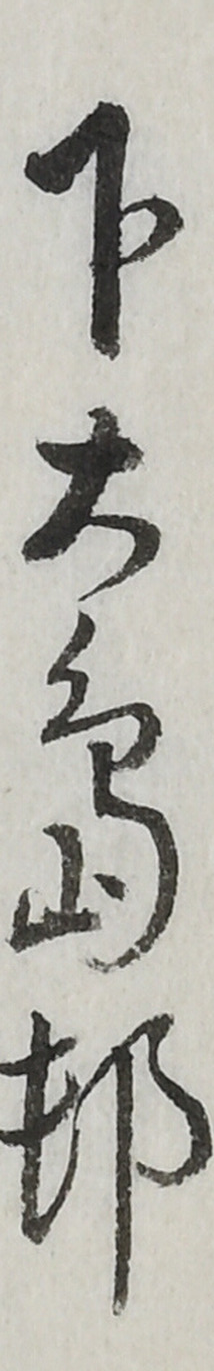下大島邨
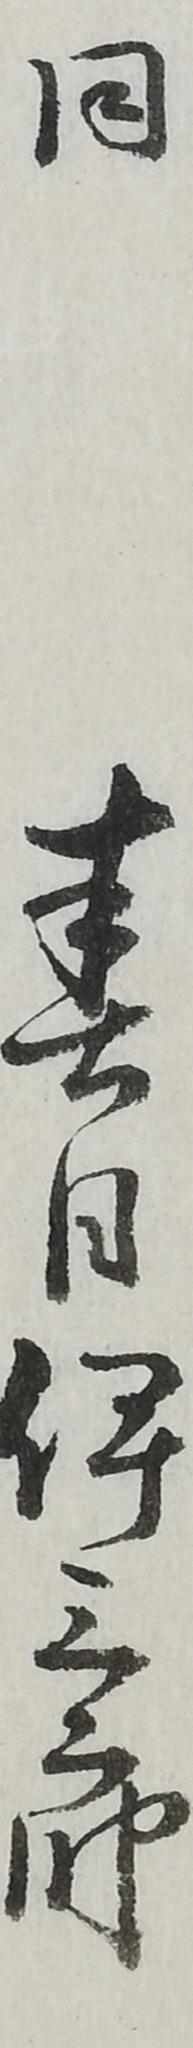同春日伊三郎
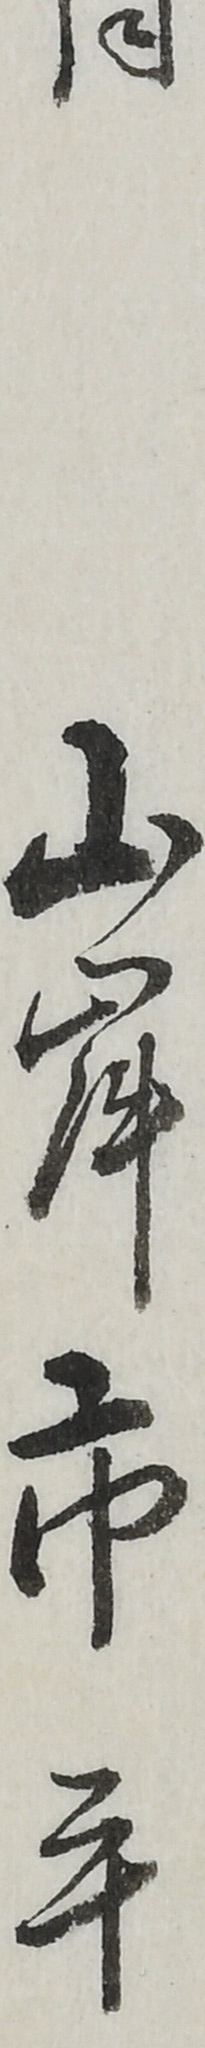同山岸市平
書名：伊那郡毎村戸長副戸長名簿
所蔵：伊那市立高遠町図書館・合同会社AMANE
